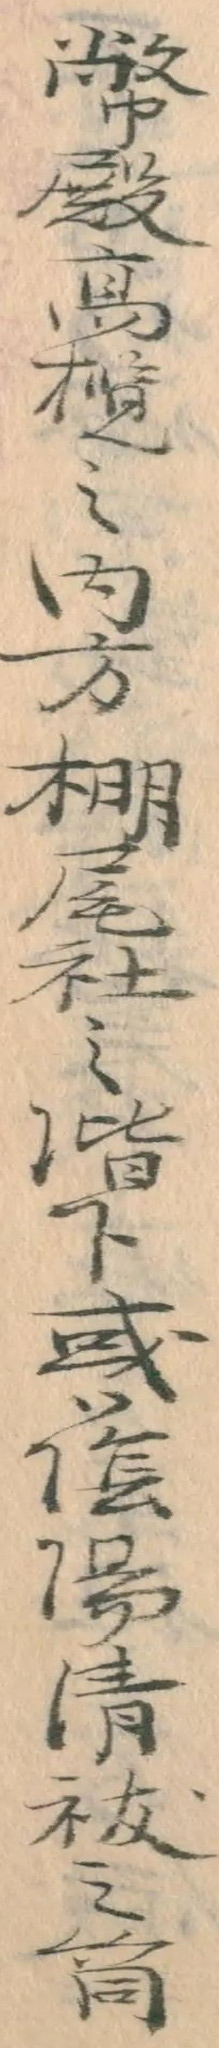幣殿高御欖之内方棚尾社之階下或ハ陰陽清祓之筒
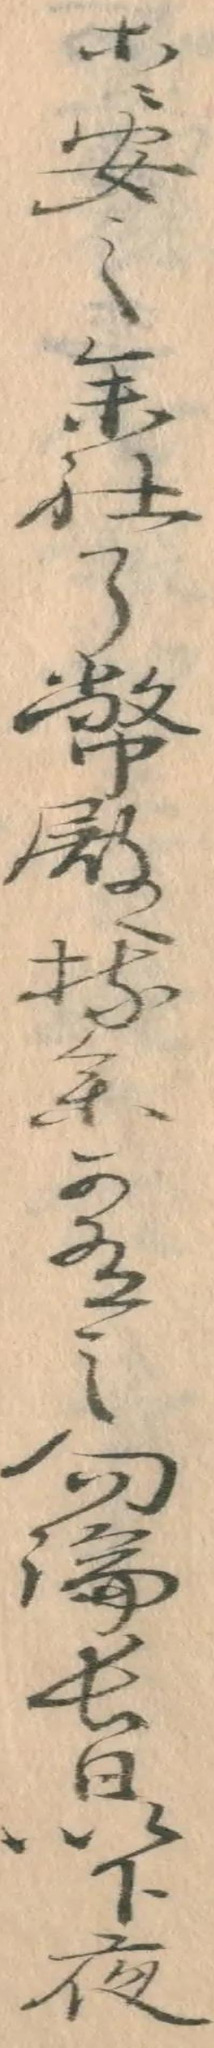等ニ安之参社了幣殿へ持参可有之勿論長日以下夜
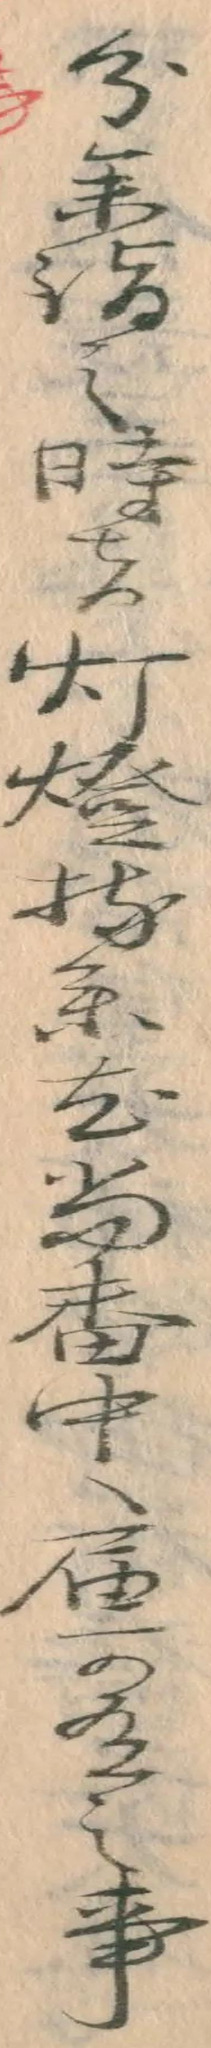分参詣之時者灯燈持参尤當番中へ届可有之事
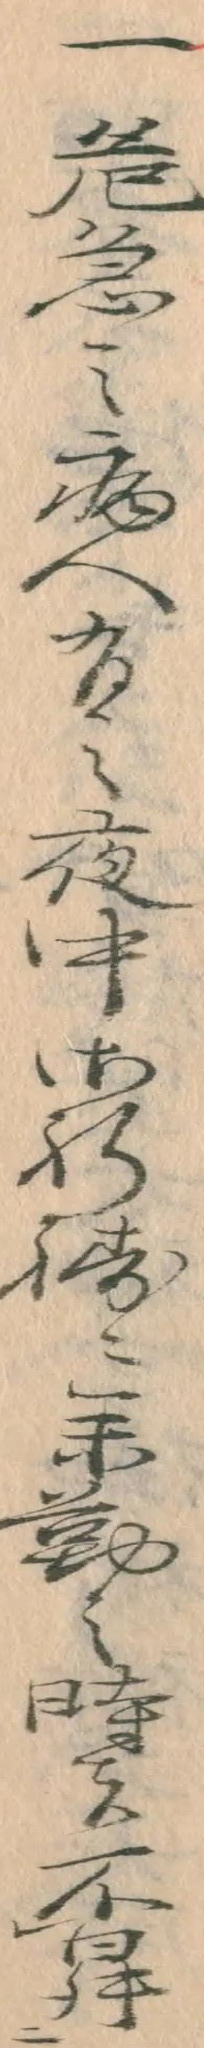一危急之病人有之夜中御祈祷ニ参勤之時者不昇
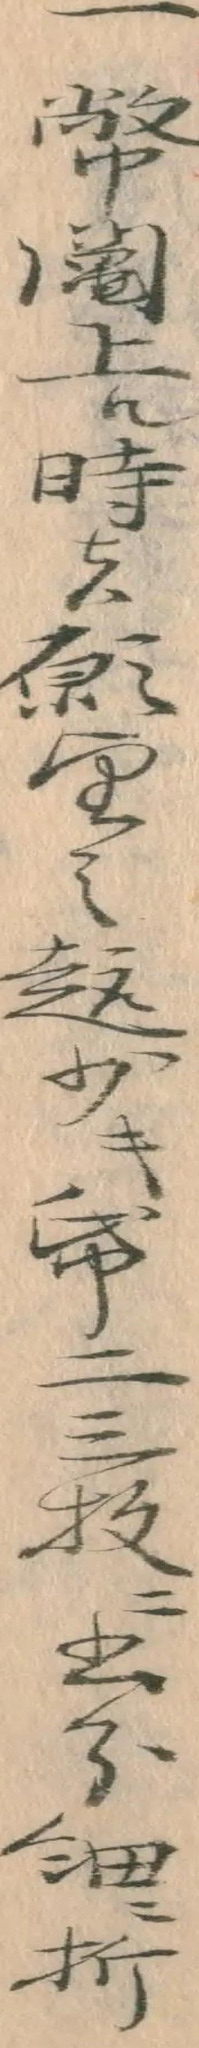一幣鬮上ル時者願望之趣少キ帋二三枚ニ書分細ニ折
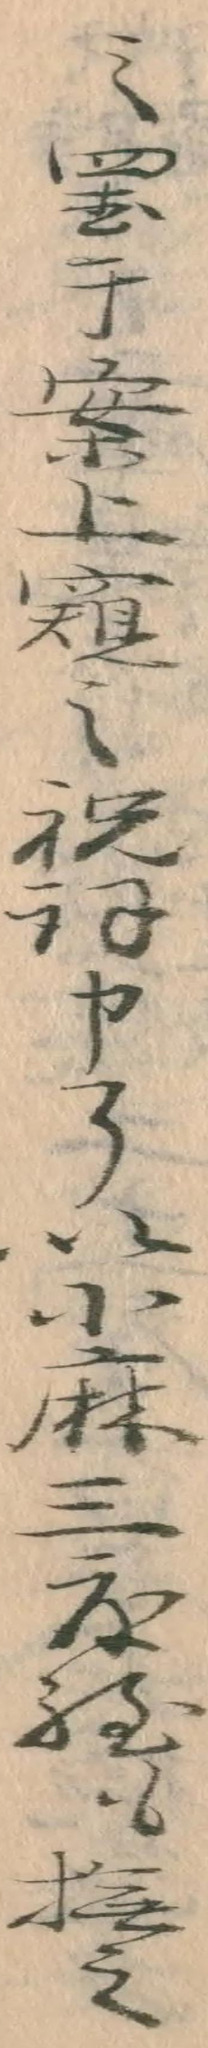之置于案上窺之祝詞申了以小麻三度程も撫之
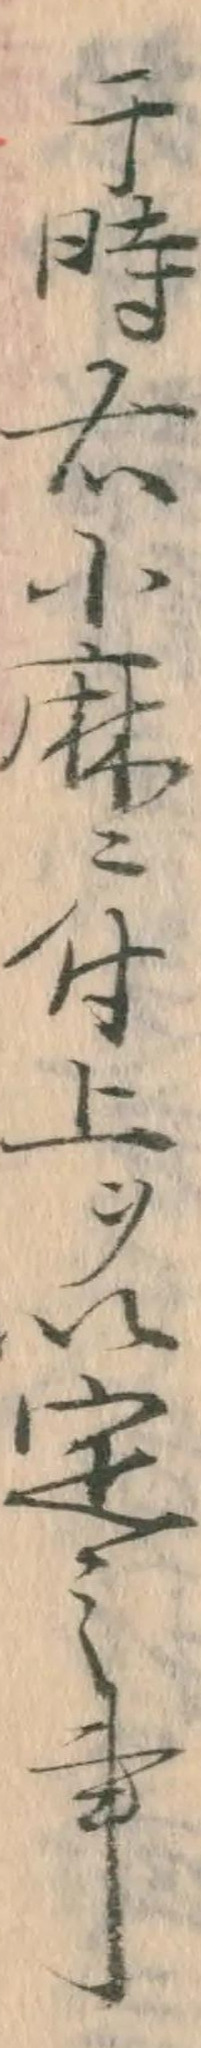于時右小麻ニ付上ヲ以定之事
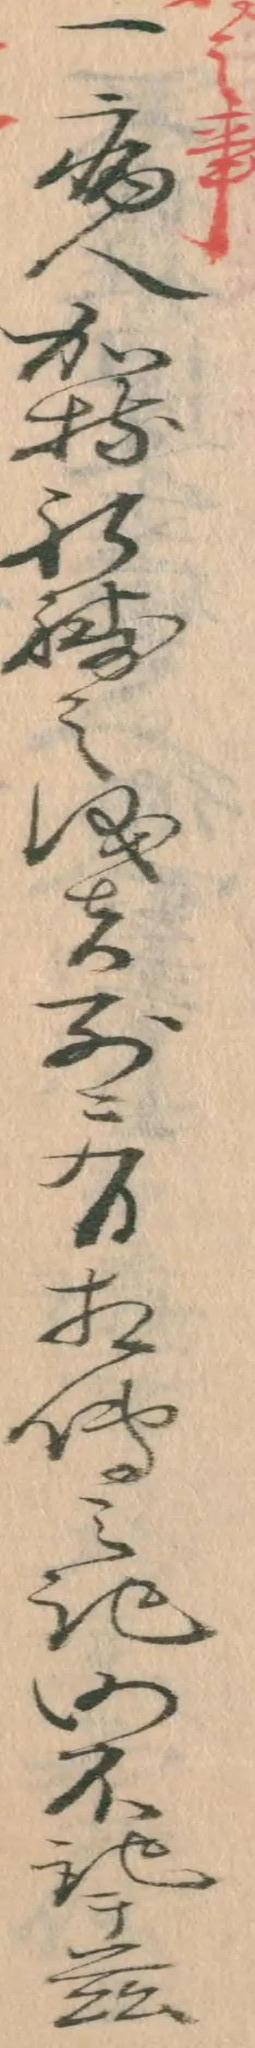一病人加持祈祷之儀者前に有相傳之記仍不記于茲
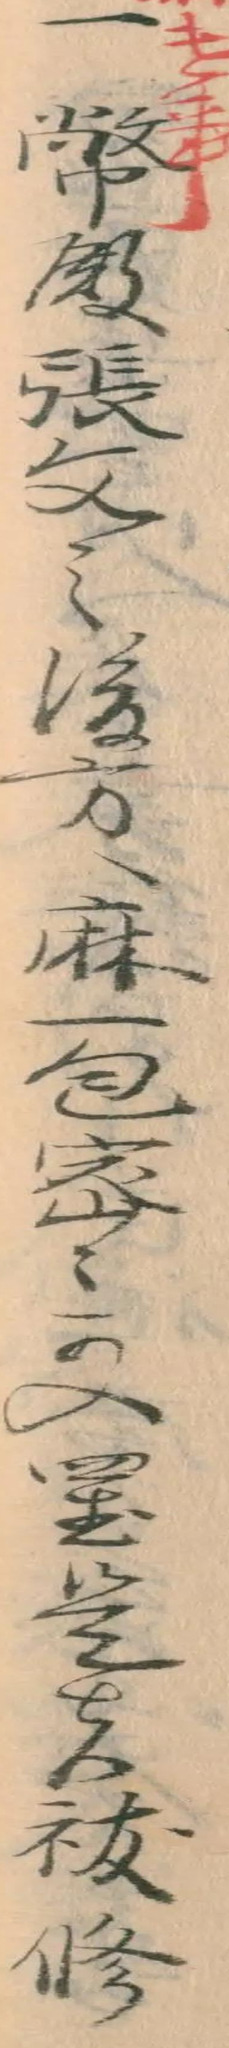一幣殿張文之後方へ麻一包密々可入置是者祓修
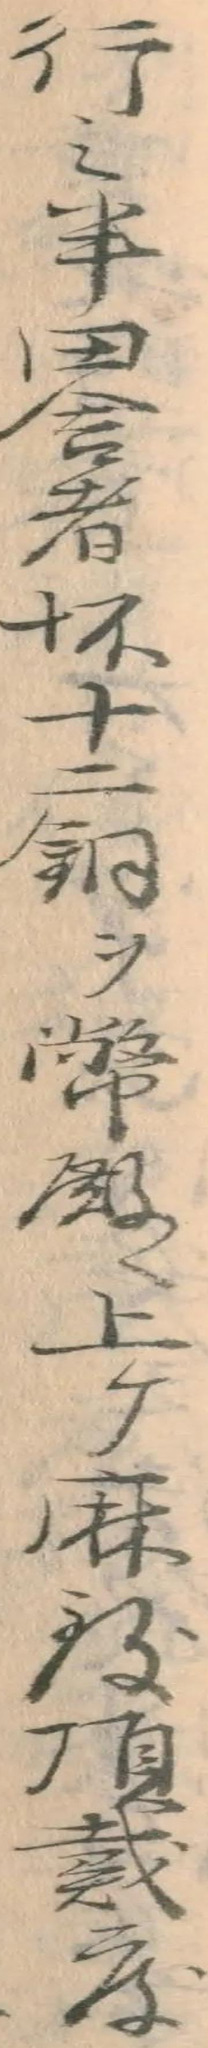行之半田舎者怀十二銅ヲ幣殿へ上ケ麻致頂戴度
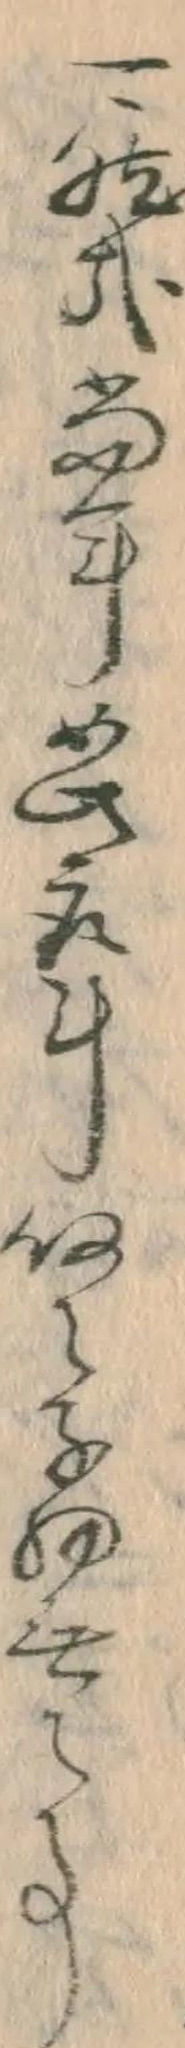可然哉當年如此取斗何之子細無之事
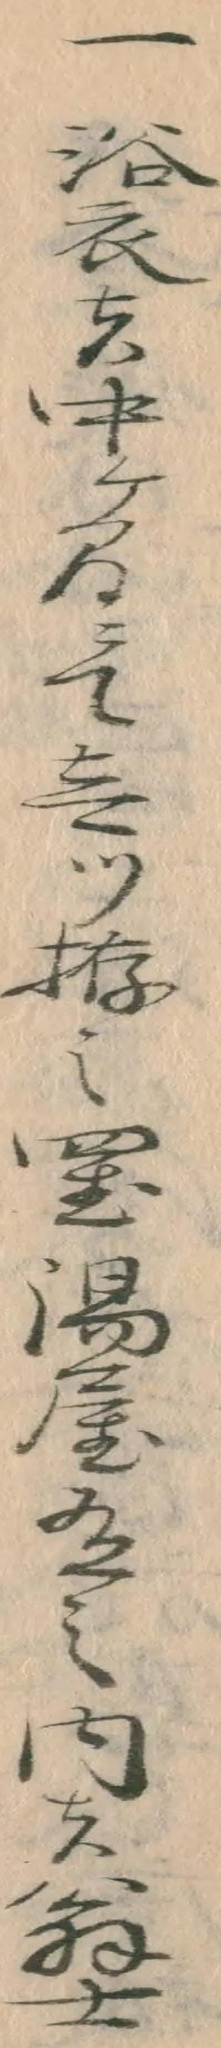一浴衣者中ヶ間ニて壱ツ拵之置湯屋有之内者翁士
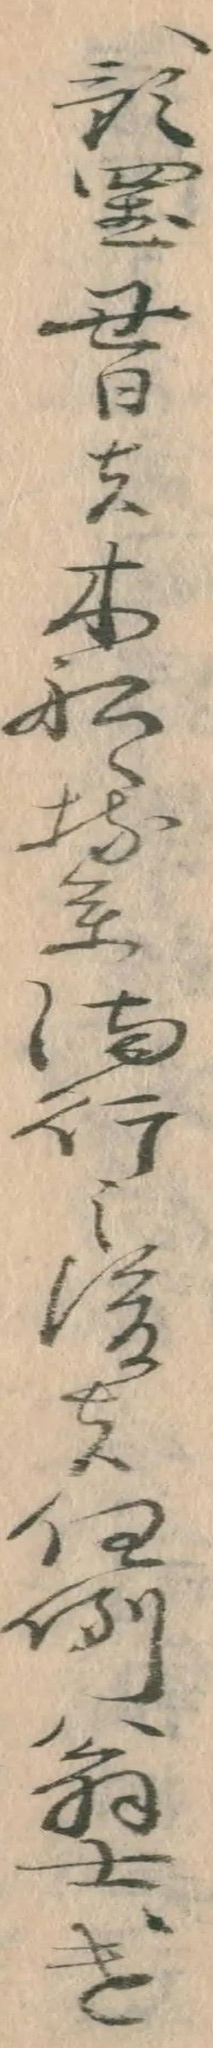ヘ預置丑日者木舩へ持参満行之後者任例翁士へ遣
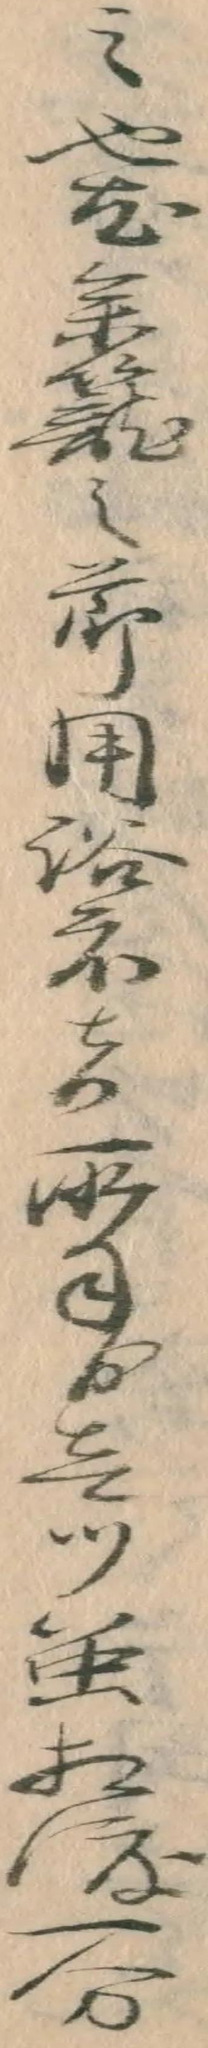之也尤参籠之節用浴衣者所司ゟ壱ツ相渡一分
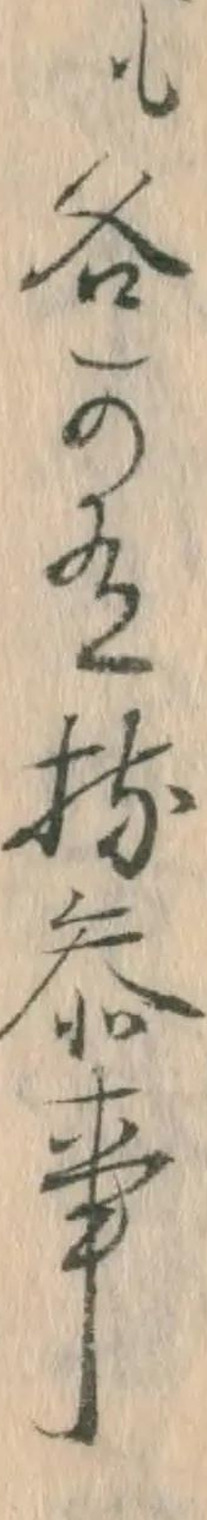ニも各可有持参事
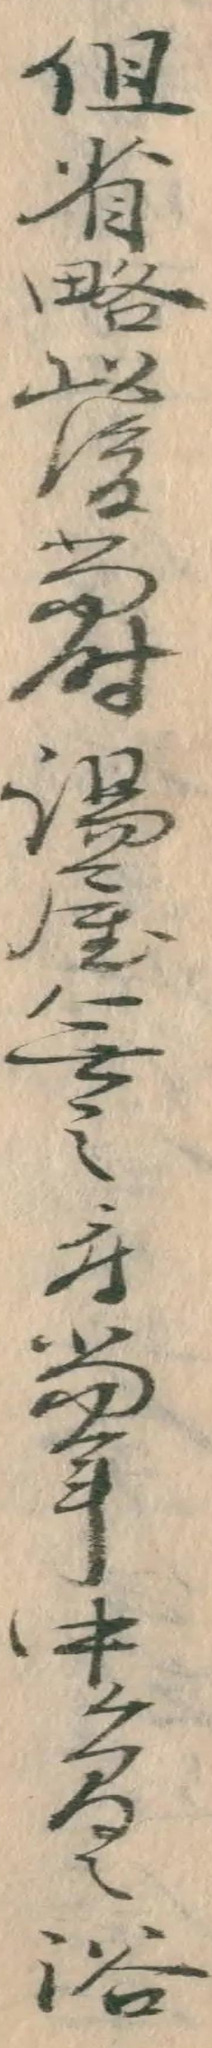但省略以後當時湯屋無之ニ付當年中ヶ間之浴
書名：賀茂社記録. 第72冊
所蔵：国立国会図書館 National Diet Library, JAPAN
